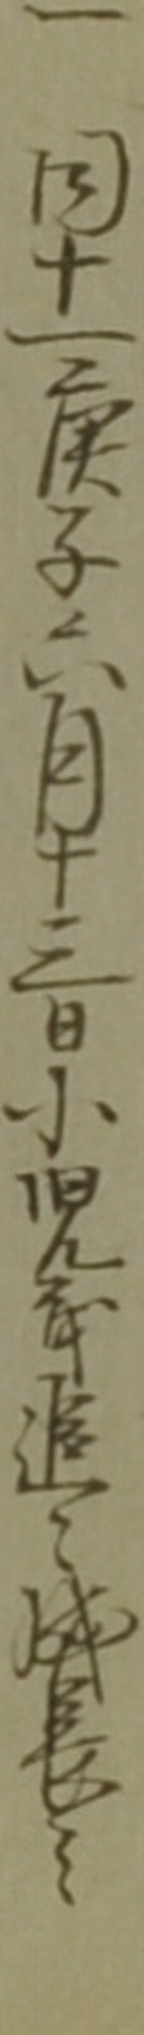一同十一庚子六月十三日小児茂追々成長之
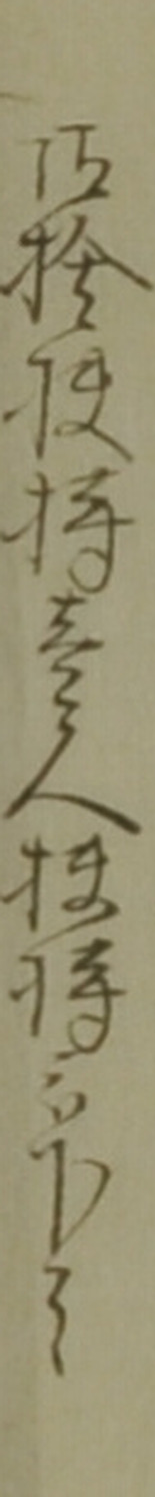御捨扶持壱人扶持被下之
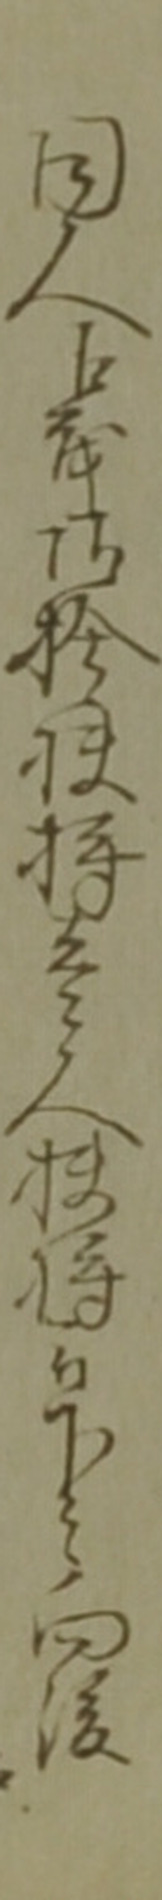同人江茂御捨扶持壱人扶持被下之向後
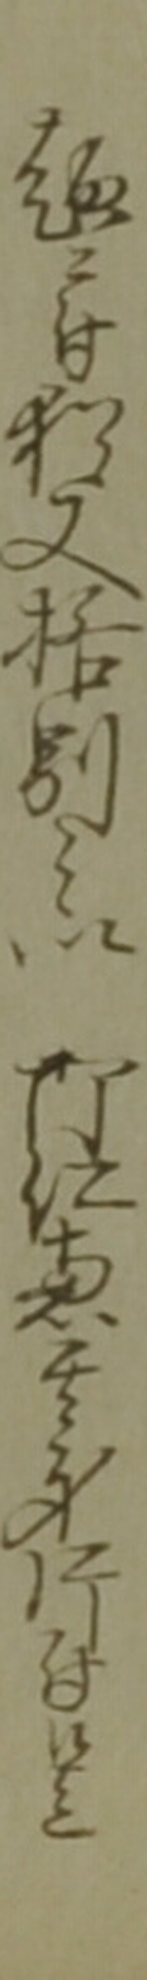趣ニ付猶又格別之以御仁恵其身片付候迄
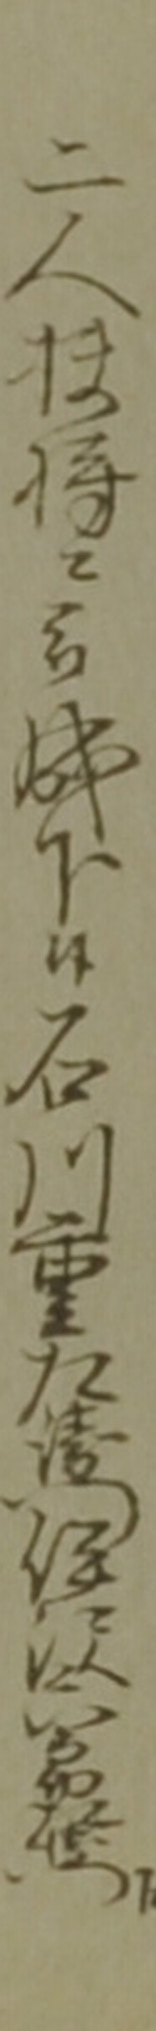二人扶持ニ被成下候石川重左衛門伊沢六郎左衛門江
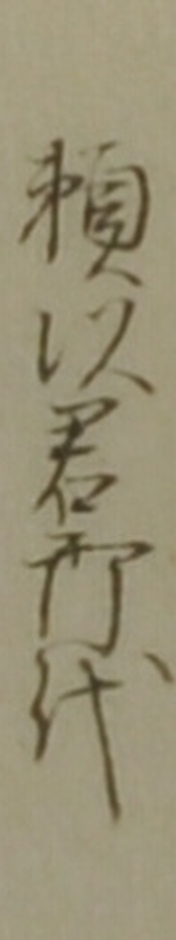頼以君御代
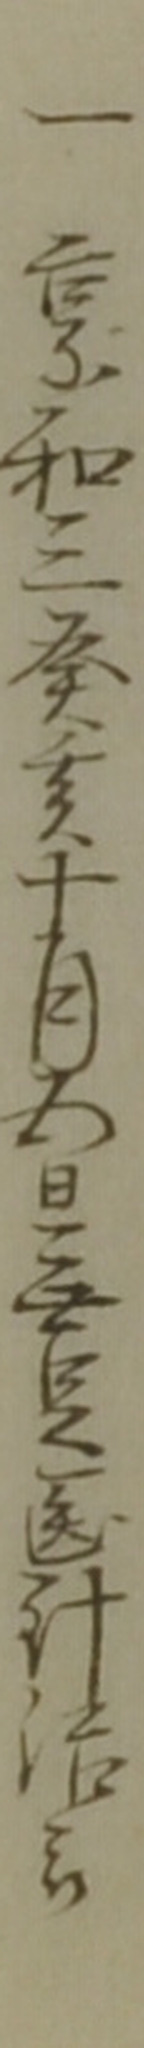一享和三癸亥十月五日無足医針治被
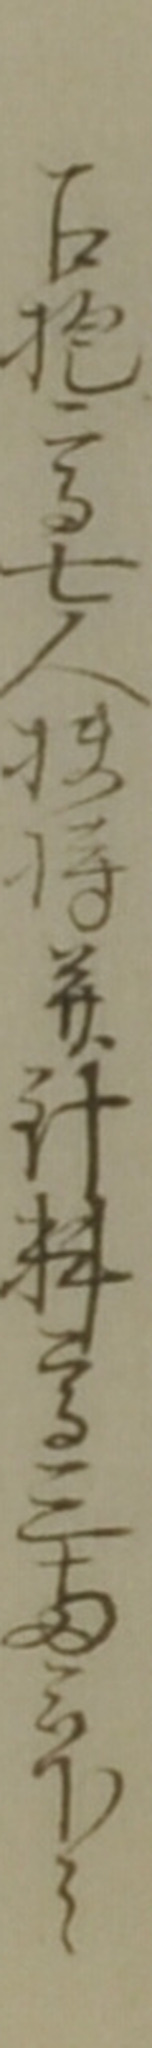召抱高七人扶持并針料高三両被下之
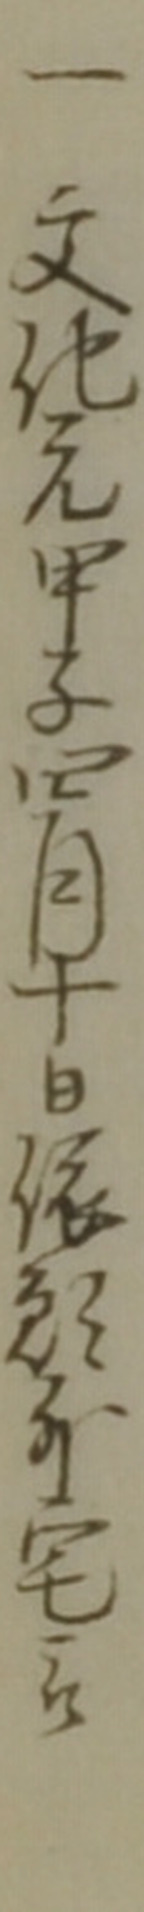一文化元甲子四月十日依願外宅被
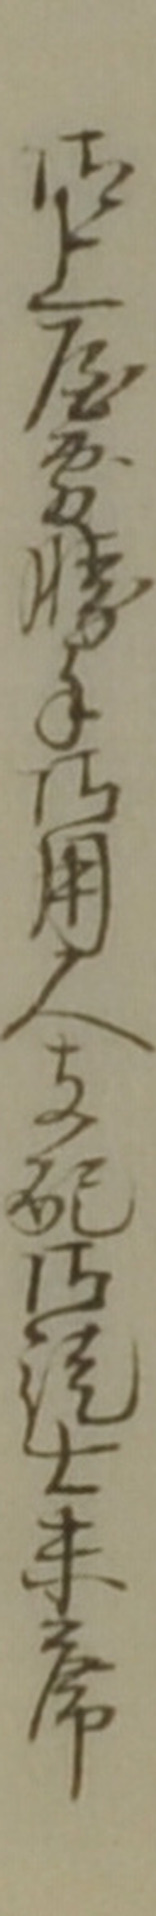御上屋敷勝手御用人支配御徒士末席
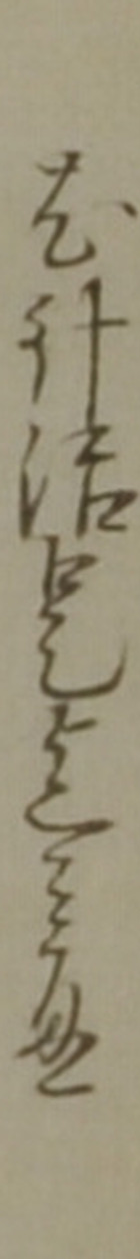尤針治是迄之通
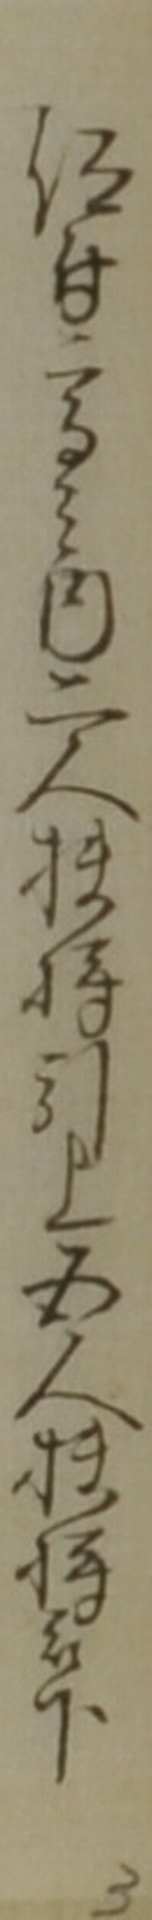仰付高之内二人扶持引上五人扶持被下
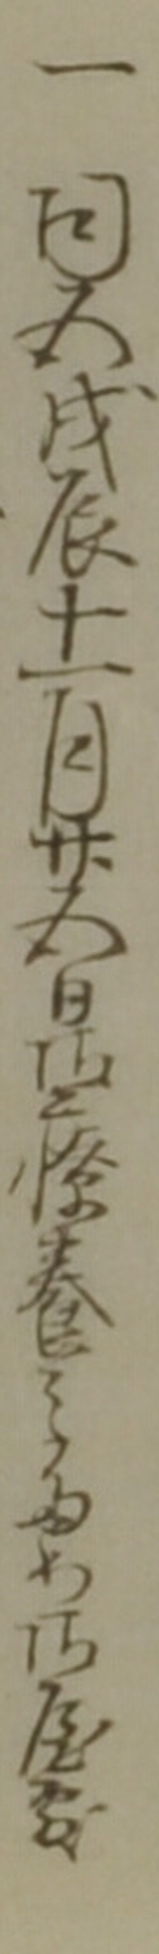一同五戊辰十一月廿五日御療養之ため御屋敷
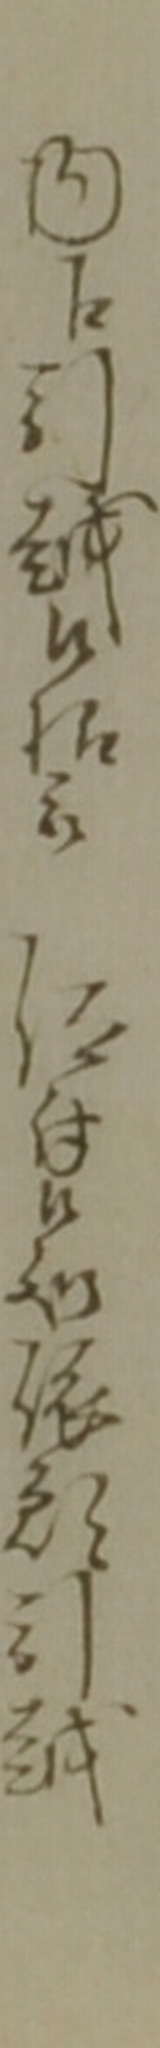内江引越候様被仰付候処依願引越
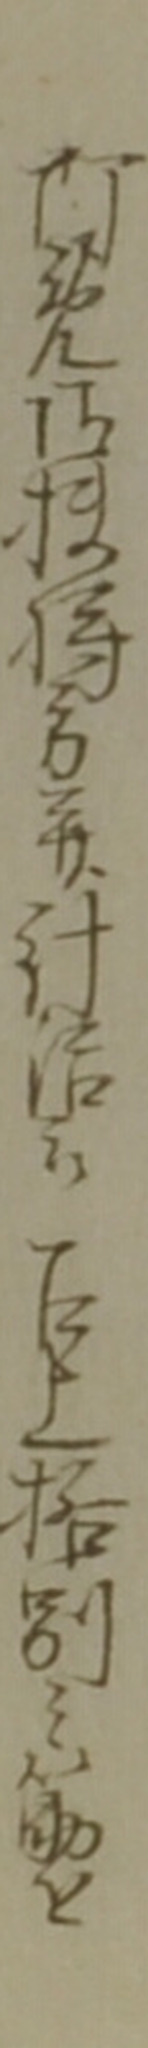御免御扶持方并針治被召上格別之筋を
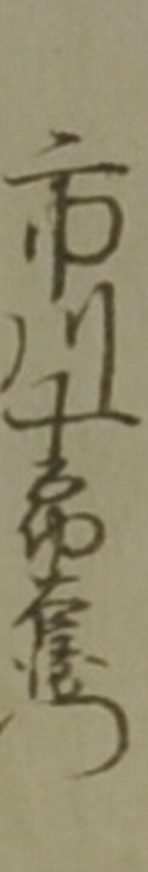市川十郎右衛門
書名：無足廃家（壱）
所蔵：伊那市立高遠町図書館・合同会社AMANE
